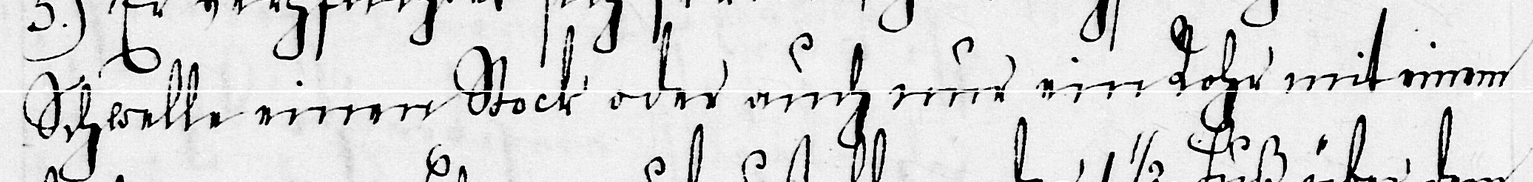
Schwelle einen Stock oder auch nur ein Rohr mit einem
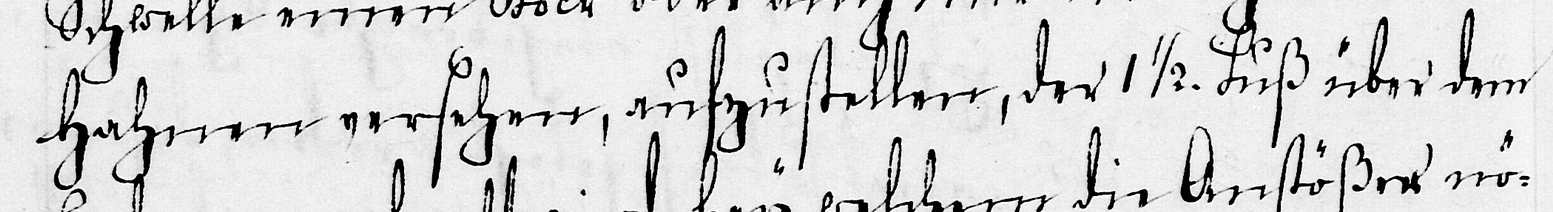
Hahnen versehen, aufzustellen, der 1 ½. Fuß über dem
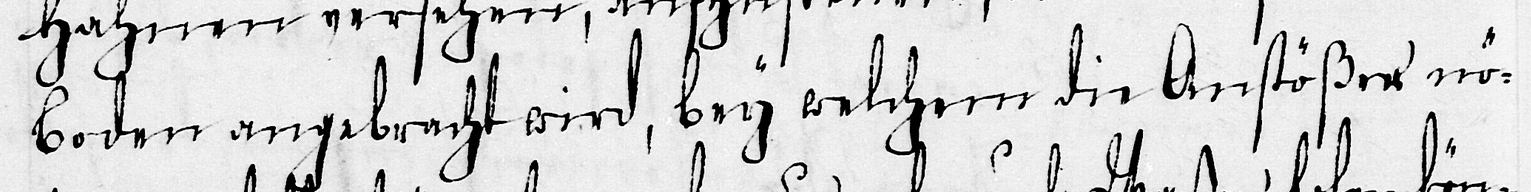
Boden angebracht wird, bey welchem die Anstößer nö¬
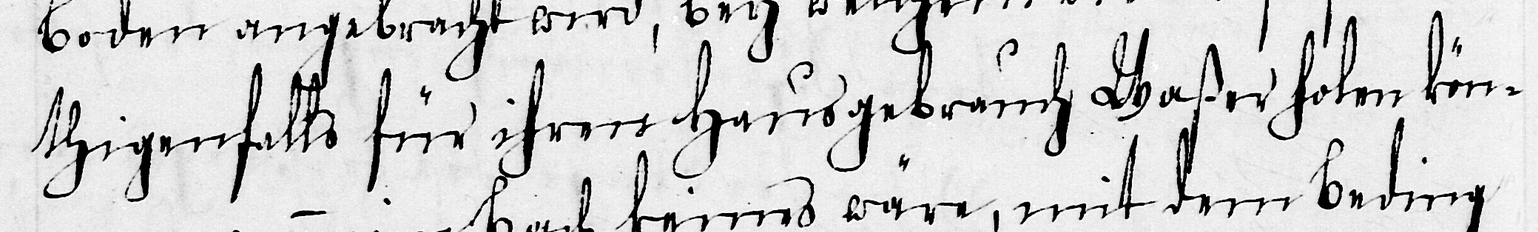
thigenfalls für ihren Hausgebrauch Waßer holen kön¬
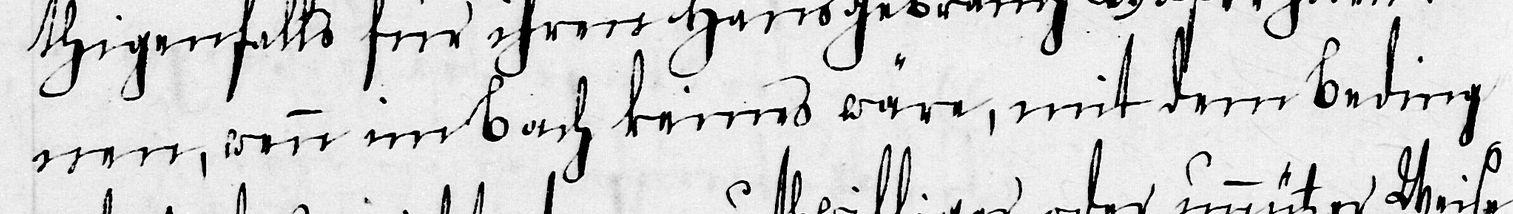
nen, wenn im Bach keines wäre, mit dem Beding
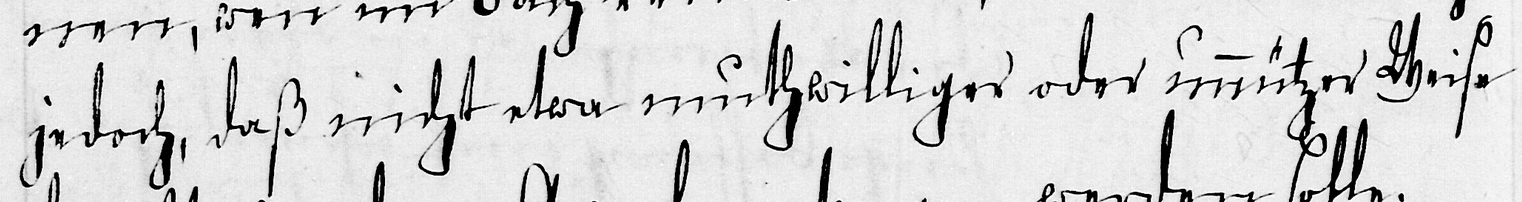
jedoch, daß nicht etwa muthwilliger oder unnützer Weise
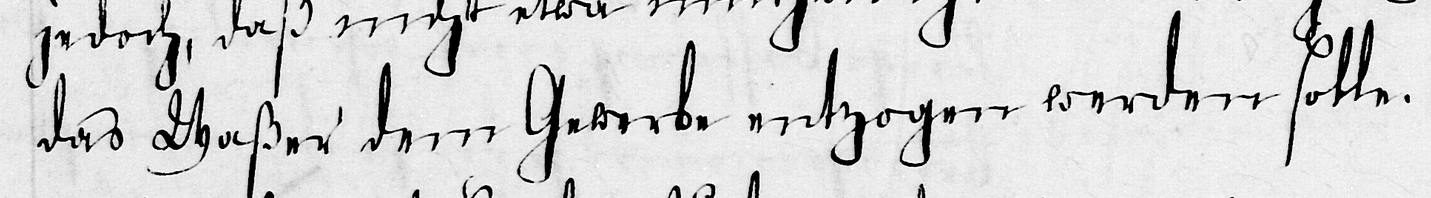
das Waßer dem Gewerbe entzogen werden solle.
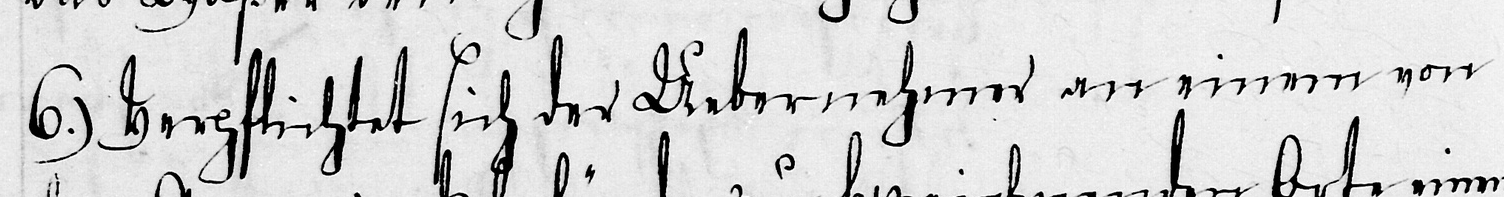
6.) Verpflichtet sich der Uebernehmer an einem von
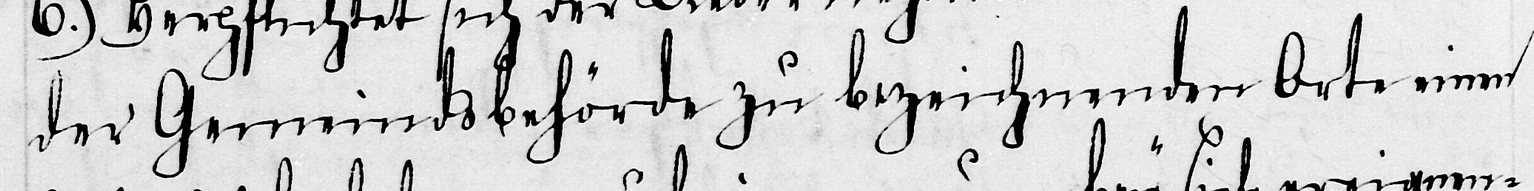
der Gemeindsbehörde zu bezeichnenden Orte einen
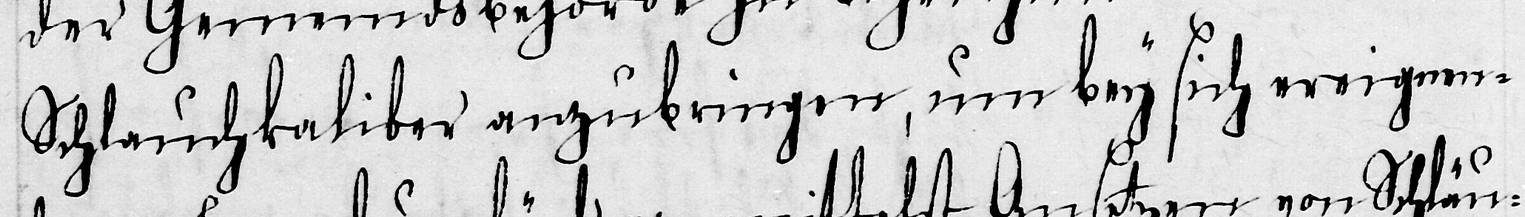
Schlauchkaliber anzubringen, um bey sich ereignen¬
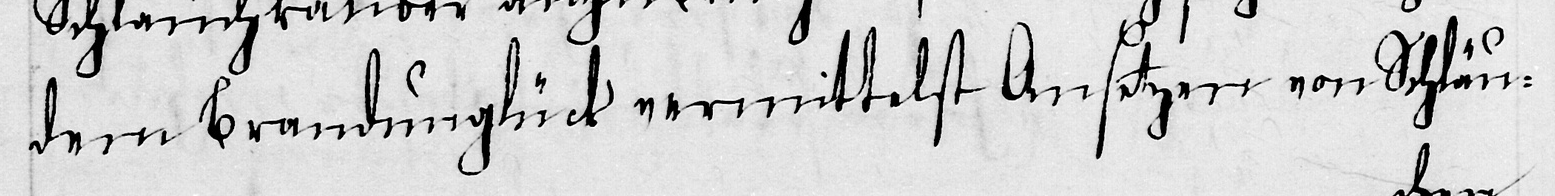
dem Brandunglück vermittelst Ansetzen von Schläu-
